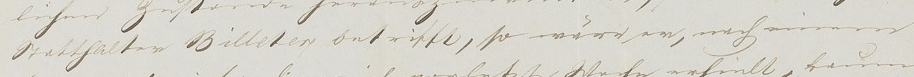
Statthalter Billeter betrifft, so wäre er, nach einem
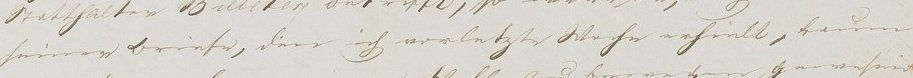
seiner Briefe, den ich vorletzte Woche erhielt, kaum
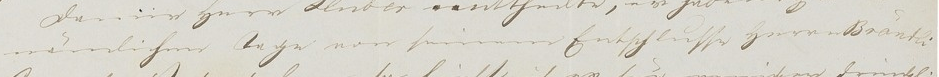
nämlichen Tage von seinem Entschlusse Herrn Brändli
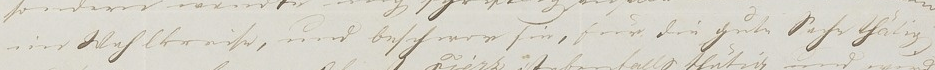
im Wahlkreise, und beschwor sie, für die gute Sache thätig
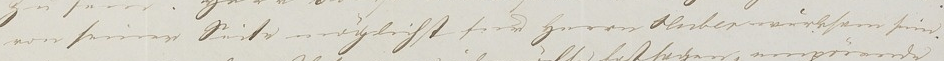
von seiner Seite möglichst für Herrn Huber wirksam sein.
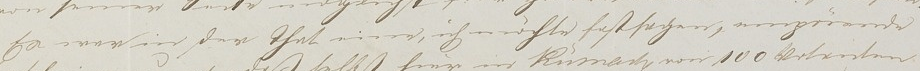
Es war in der That eine, ich möchte fast sagen, empörende
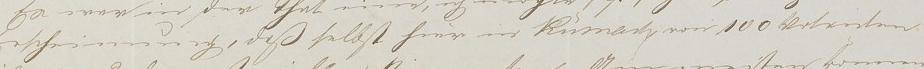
Erscheinung, daß selbst hier in Küsnach von 100 Votanten
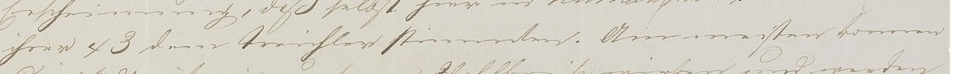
ihrer 43 dem Treichler stimmten. Am meisten können
